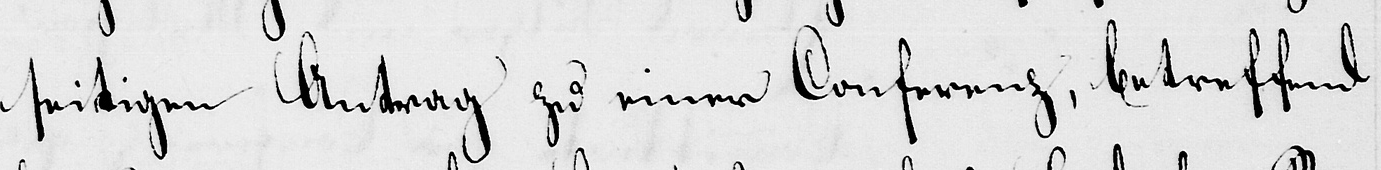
seitigen Antrag zu einer Conferenz, betreffend
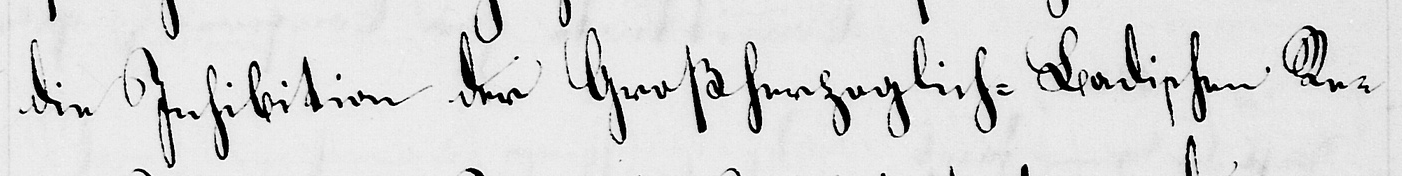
die Inhibition der Großherzoglich-Badischen Re¬
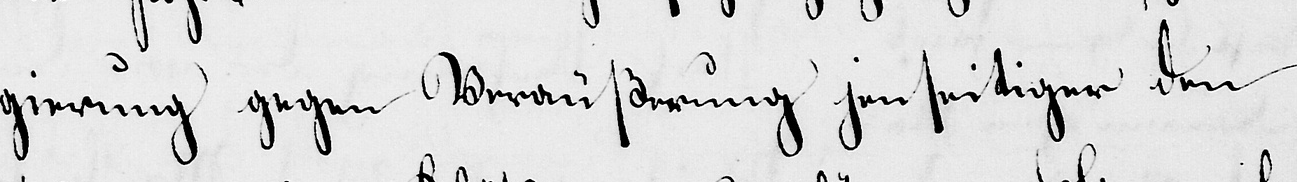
gierung gegen Veräußerung jenseitiger den
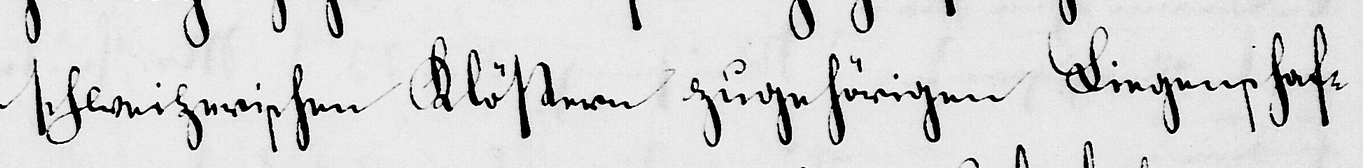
schweizerischen Klöstern zugehörigen Liegenschaf¬
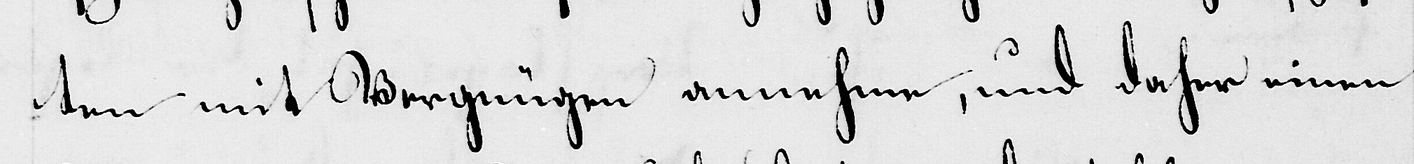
ten mit Vergnügen annehme, und daher einen
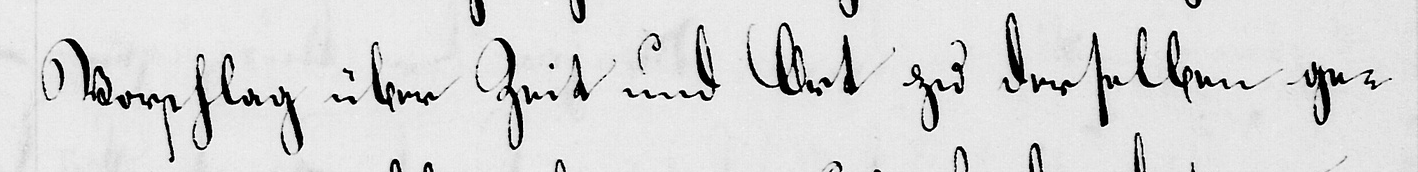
Vorschlag über Zeit und Art zu derselben ge¬
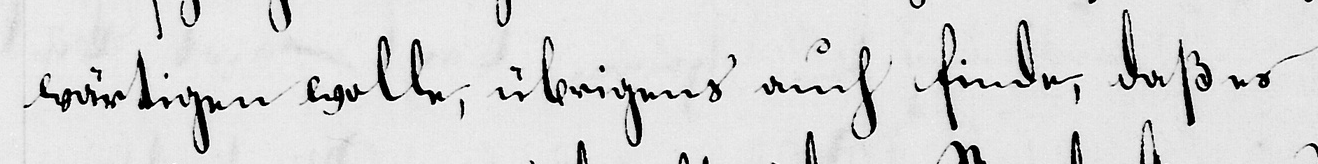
wärtigen wolle, übrigens auch finde, daß es
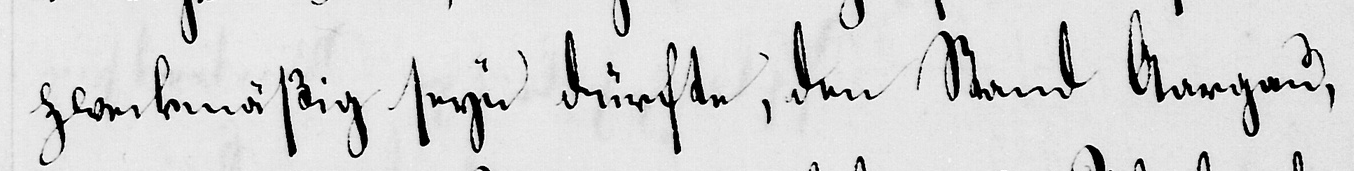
zweckmäßig seyn dürfte, den Stand Aargau,
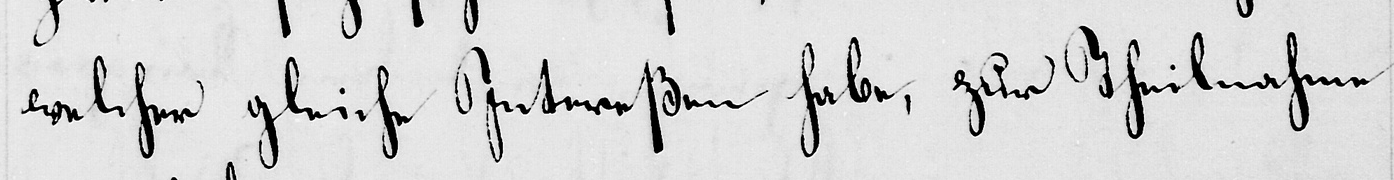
welcher gleiche Intereßen habe, zur Theilnahme
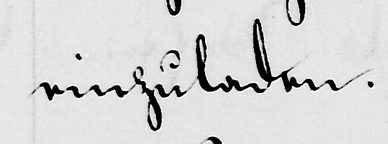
einzuladen.
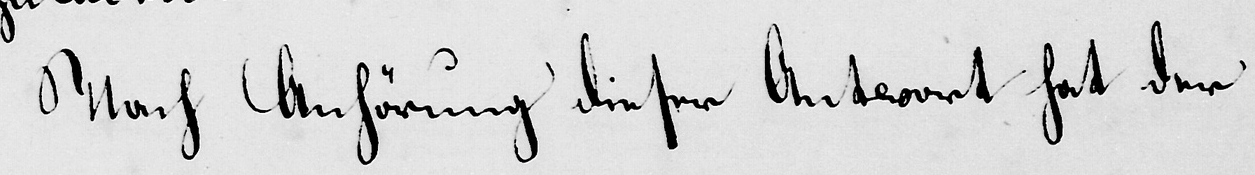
Nach Anhörung dieser Antwort hat der
